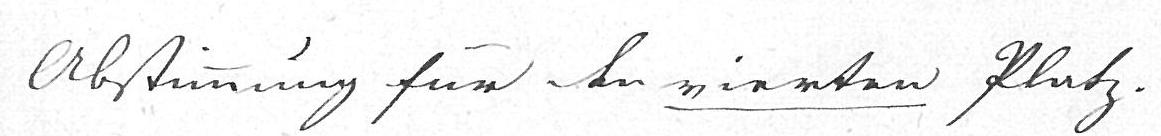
Abstimmung für den vierten Platz.
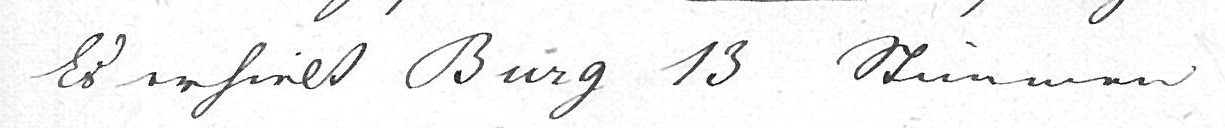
Es erhielt Burg 13 Stimmen
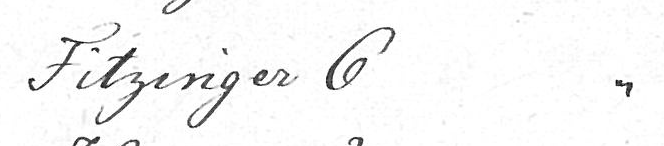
Fitzinger 6 "
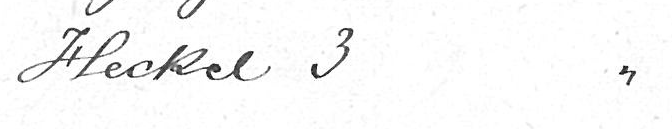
Heckel 3 "
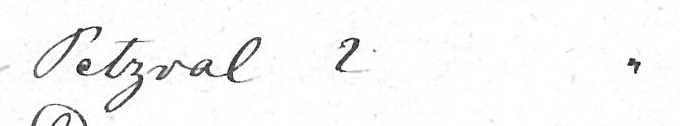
Petzval 2 "
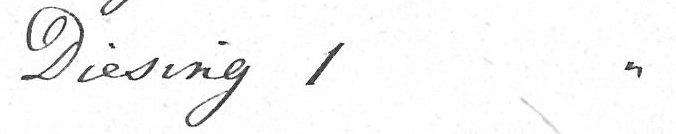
Diesing 1 "
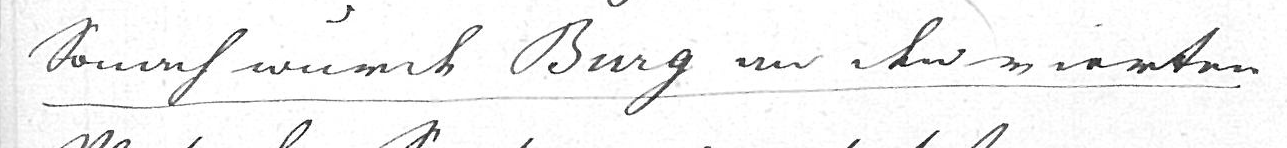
Sonach wurde Burg an den vierten
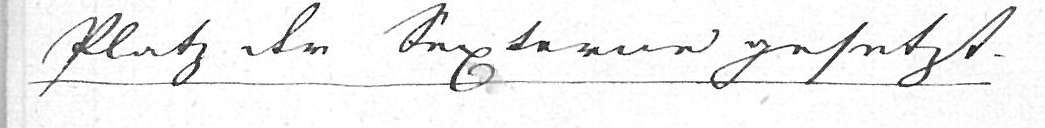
Platz der Sexterne gesetzt.
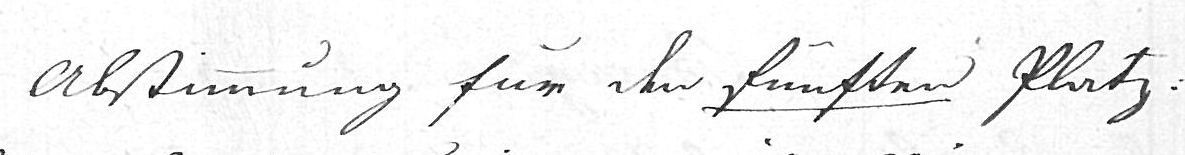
Abstimmung für den fünften Platz:
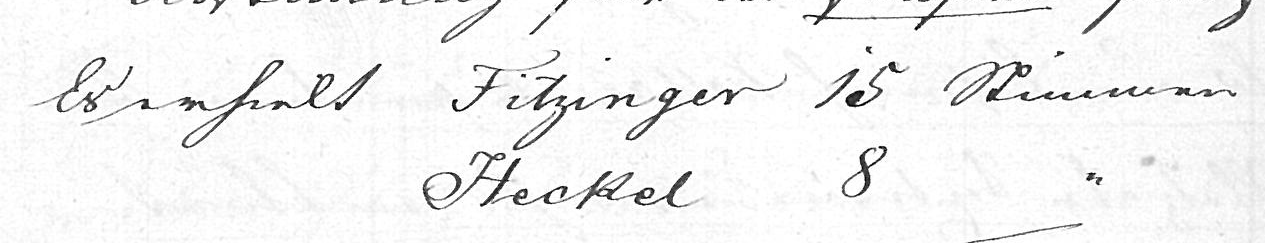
Es erhielt Fitzinger 15 Stimmen
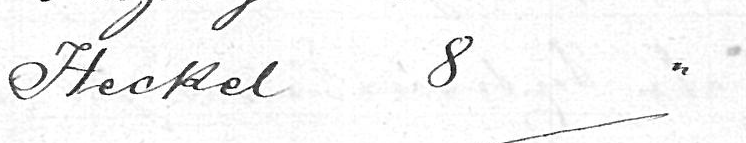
Heckel 8 "
